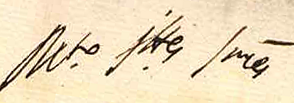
M.to I.ltes Snrēs
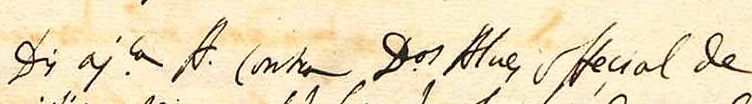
Dis a j.ca A. Contra D.os Alues offeçial de
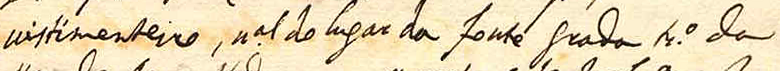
uestimenteiro, n.al do lugar da fonte grada tr.o da
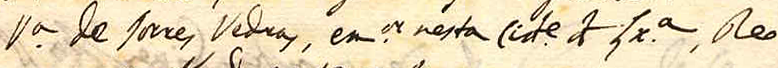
Va. de Torres Vedras, e m.or nesta Cid̄.e d̄ Lx.a, Reo
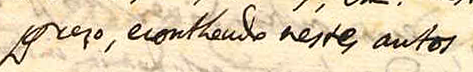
prezo, e contheudo nestes autos
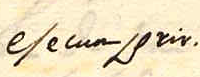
e se cumprir.
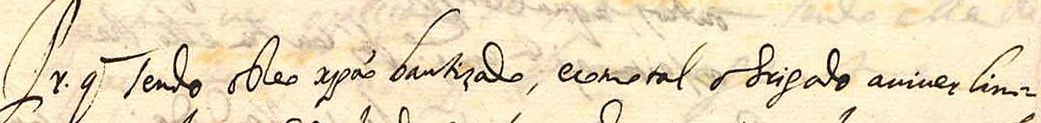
Pr. q̄ sendo o Reo xpaõ bautizado, e como tal obrigado a uiuer lim
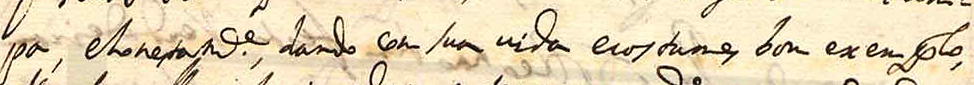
pa, e honestam.te, dando com sua uida e costumes bom exemplo,
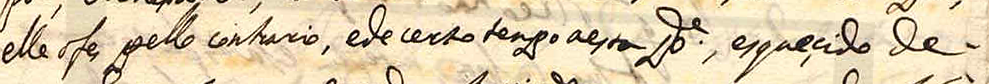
elle o fes pello contrario, e de certo tempo a esta pte, esqueçido de
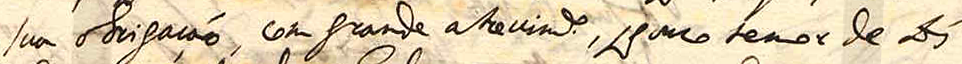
sua obrigaçaõ, com grande atreuim.to, pouco temor de Ds̄
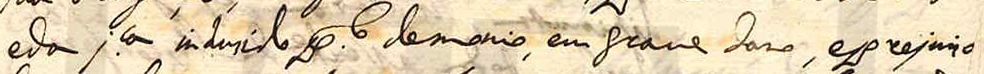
e da j.ca induzido p.lo demonio, em graue dano, e prejuizo
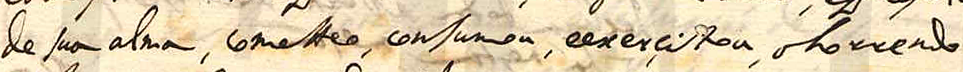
de sua alma, cometteo, consumou, e exerçitou, o horrendo
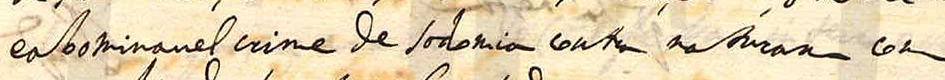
e abominauel crime de sodomia contra naturam com
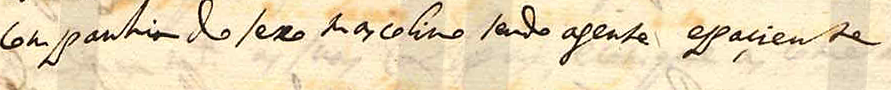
companhia do sexo mascolino sendo agente e paçiente
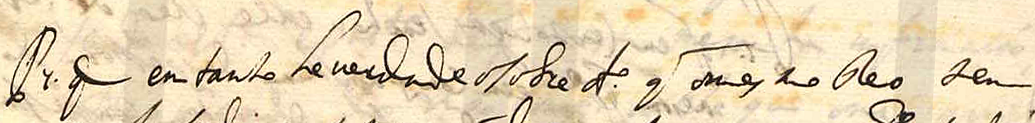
Pr. q̄ em tanto he uerdade o sobre d̄.o q̄ o mesmo Reo tem
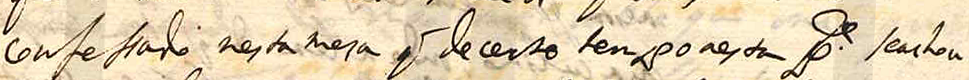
confessado nesta meza q̄ de certo tempo a esta p.te se achou
